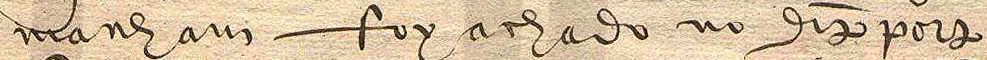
manham foy achado no dito porto
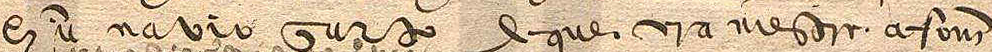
hū navio surto de que era mestre afom̄
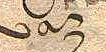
vaz
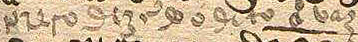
preso dizēdo o dito ao vaz
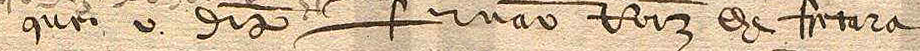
que o dito fernão Roīz lhe fretara
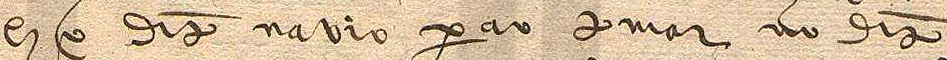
ho dito navio ꝑa o tomar no dito
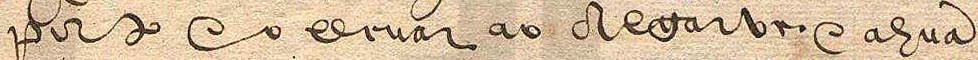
porto e o lleuar ao Algarve e a huā
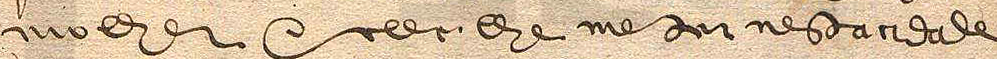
molher e elle lhe meter nesta cidade
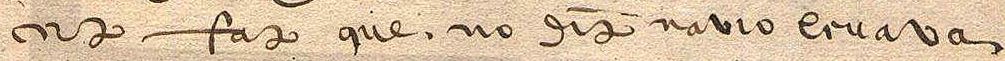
certo fato que no dito navio leuava
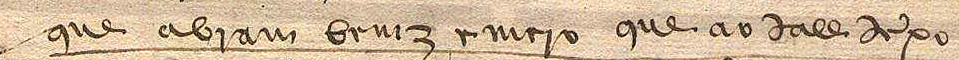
e que abram benizemero que ao tall tēpo
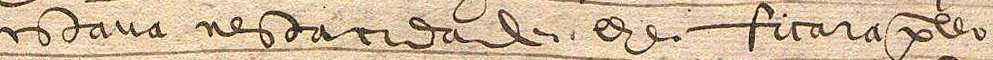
estaua nesta cidade lhe ficara p̄llo
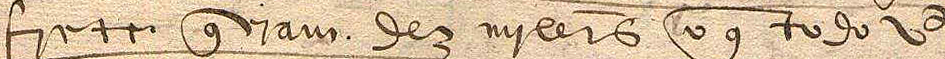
frete q̄ eram dez mjll r̄s o q̄ todo vto
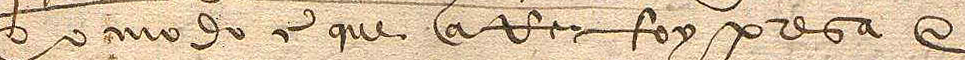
e o modo ē que a Re foy presa e
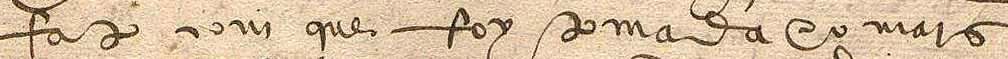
fato com que foy tomada e o majs
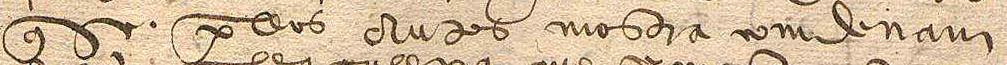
q̄ se p̄llos Autos mostra comdenam
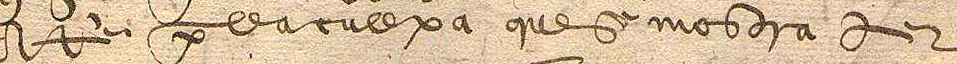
A Re p̄lla cullpa que se mostra ter
